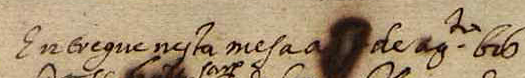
Entregue nesta mesa a _ de ag.to 616
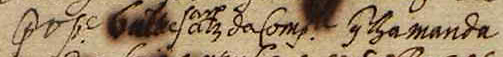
p̄ o p.e baltesar al̄z da Comp.a q̄ lha manda
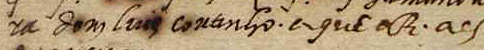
ra Dom luis coutinho a quē o R. a es
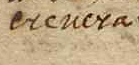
creuera.
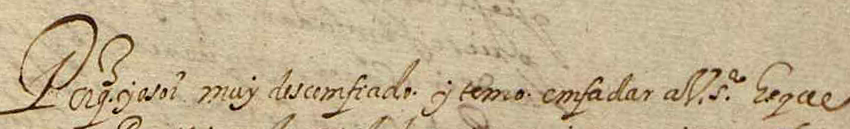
Porq̄ yo soi muy descomfiado y temo emfadar a V. s.a he que
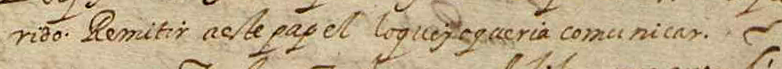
rido Remitir a este papel lo que yo queria comunicar.
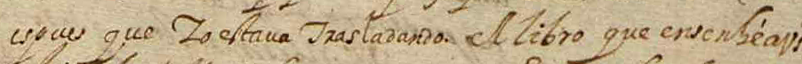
es pues que Yo estaua trasladando el libro que ensenhé a V s.a
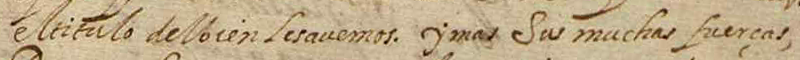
el titulo del bien le sauemos. y mas Sus muchas fuerças,
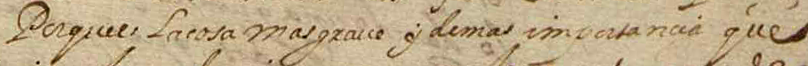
Porque es La cosa mas graue, y de mas importancia que
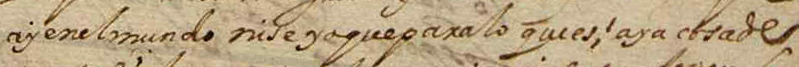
ay nel mundo ni se ya que para lo que es, aya cosa de
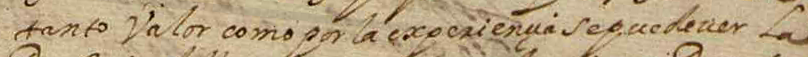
tanto Valor como por la experiencia se puede de uer la
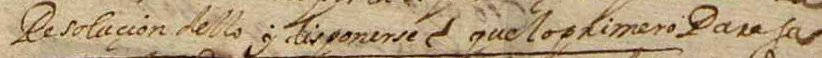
Resolucion dello y disponerse que lo primero Para sa
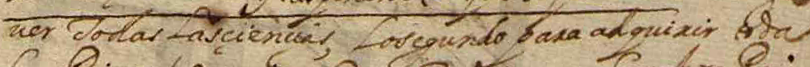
uer Todas las ciencias, lo segundo para adquirir toda
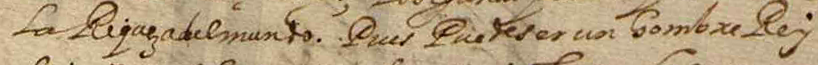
la Riqueza del mundo. Pues Puede ser un hombre Rey
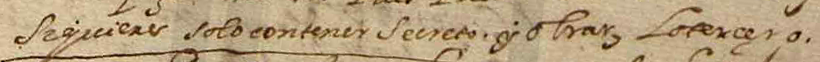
Si quiere solo con tener secreto. y obrar, Lo tercero
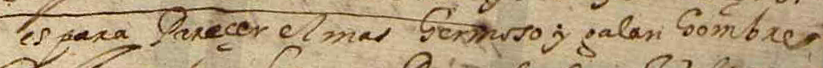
es para Parecer al mas hermoso y galan hombre
